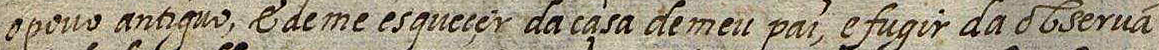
o pouo antiguo, e de me esqueçer da casa de meu paī, e fugir da obseruā
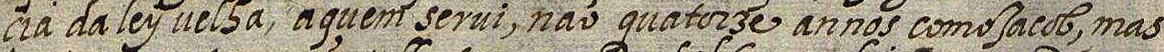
çia da ley uelha, a quem serui naõ quatorze annos como Jacob, mas
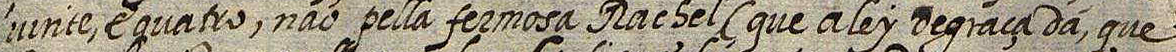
uinte, e quatro, naõ pella fermosa Rachel (que a ley de graça dá, que
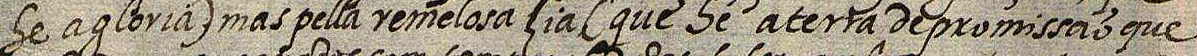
he a gloria) mas pella remelosa Lia (que hé a terra de promissaõ que
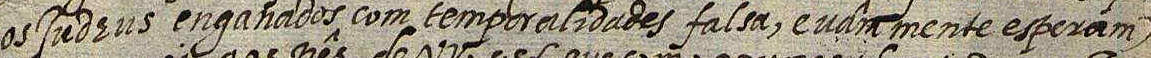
os JudEus enganados com temporalidades falsa, e vâmente esperam)
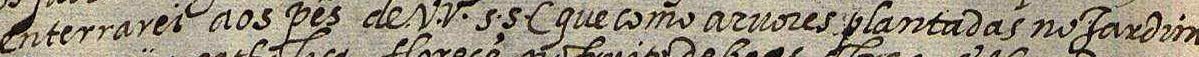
enterrarei aos pês de .V.V. s.s. (que como aruores plantadas no Jardim
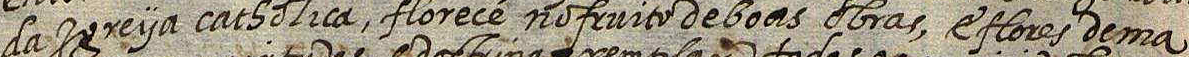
da Jgreija catholica, florecē no fruito de boas obras, e flores de ma
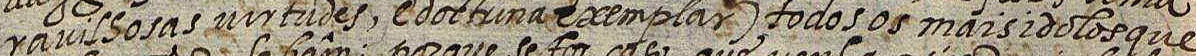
rauilhosas uirtudes, e doctrina exemplar) todos os mais idolos que
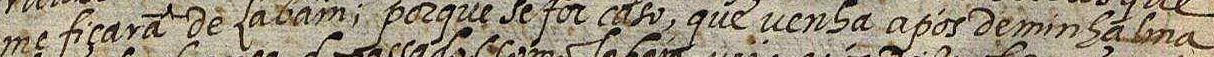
me ficarā de Labâm; porque se for caso, que uenha após de minhalma
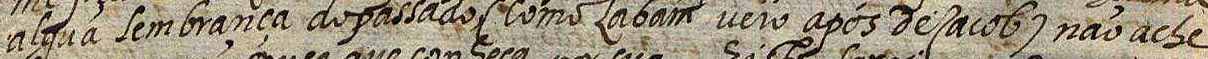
alguā lembrança do passado, (como Labam ueio após de Jacob) naõ ache
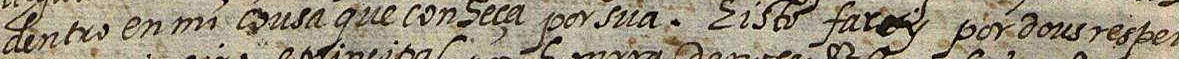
dentro en mī cousa que conheça por sua. E isto farey por dous respei
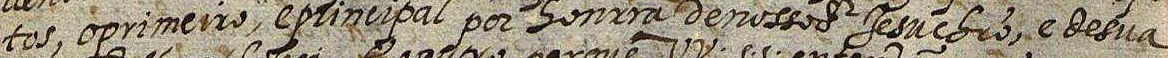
tos, o primeiro, e principal por honrra de nosso sor Jesu chrō, e de sua
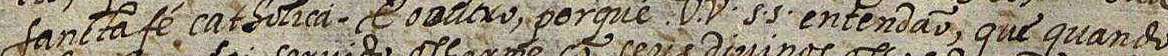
Sancta fé catholica. & o outro porque .V.V. s.s. entendaõ, que quando
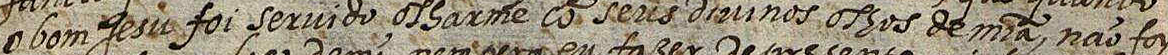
o bom Jesu foi seruido olharme cō seus diuinos olhos de mīa, naõ foy
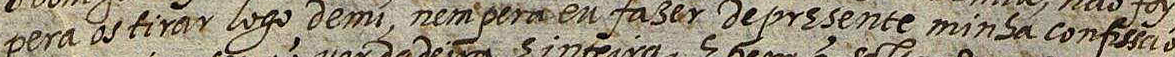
pera os tirar logo de mī, nem pera eu fazer de prEsente minha confissaõ
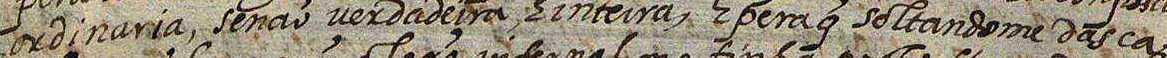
ordinaria, senaõ uerdadeira, E inteira, E pera q̄ soltandome das ca
